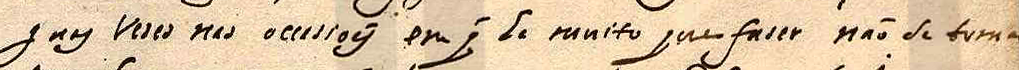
guas veses nas occasioẽs em q̄ ha muito que faser naõ se toma
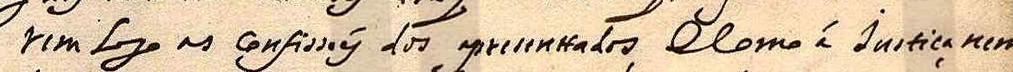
rem Logo as confissoẽs dos apresenttados, E Como á Iustiça nem
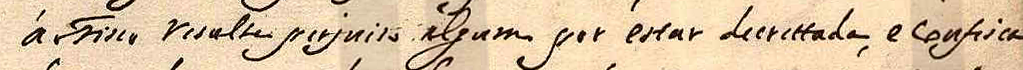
áo Fisco resulte perjuiso algum por estar decrettada, e confisca
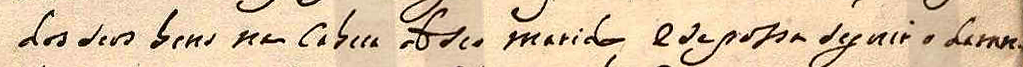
dos seos bens na cabeça d̄ seo marido, e se possa seguir o damn
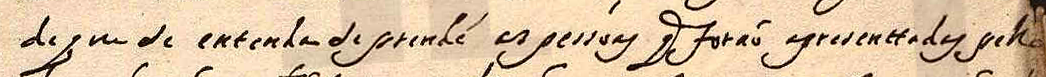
de que se entenda se prendé as pessoas q̄ foraõ apresenttadas pello
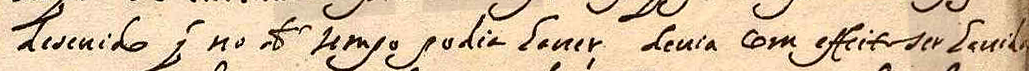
descuido q̄ no d̄o tempo podia hauer, deuia com effeito ser hauida
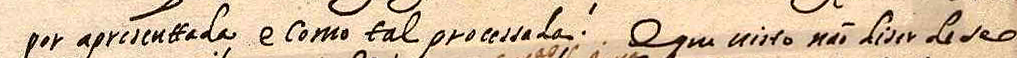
por apresenttada e como tal processada! E que uisto naõ diser de seo
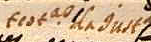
test.as da Iusta
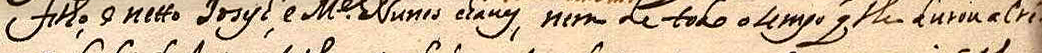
filho, e netto Ioseph, e M.el Nunes chaues, nem de todo o tempo q̄ lhe durou a Cre
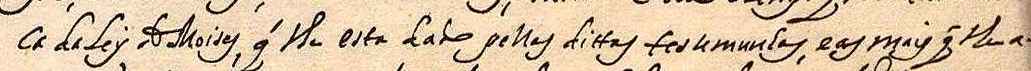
ca da Ley de Moises, q̄ lhe esta dado pellas dittas testemunhas, e as mais q̄ lhe a
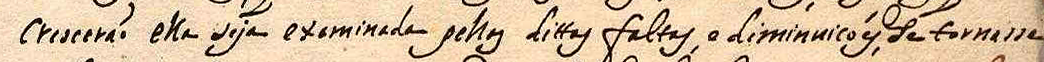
cresceraõ ella seja examinada pellas dittas faltas, e diminuiçoẽs, se tornasse
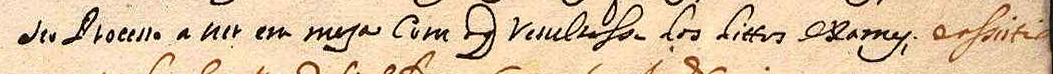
seo Processo a uer em meza com o q̄ resultasse dos dittos exames; e assistio
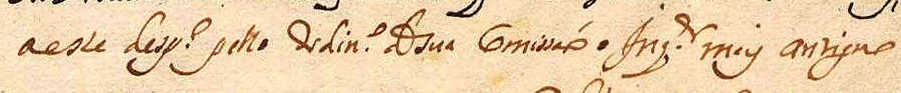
a este desp.o pello Ordin.o d̄ sua Comissaõ o Jnq.or mais antiguo
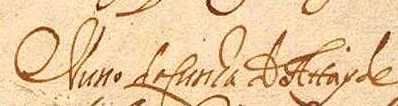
Nuno da Cunha d̄ Attayde
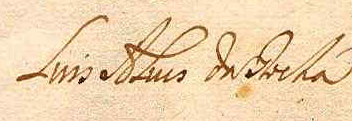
Luis Alues da Rocha
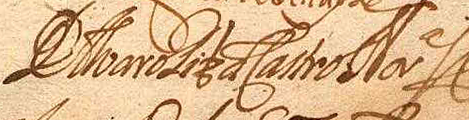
D Alvaro Rib d̄ Castro Nora
